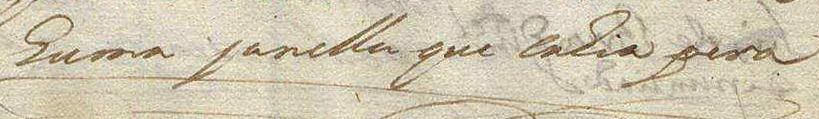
huma janella que cahia pera
